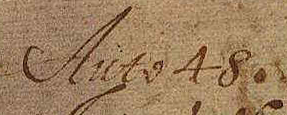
Auto 480
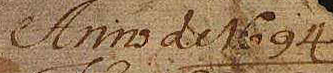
Anno de 1694
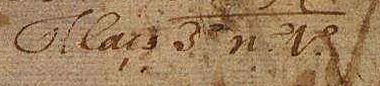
Maço 3o n.o 1.o
